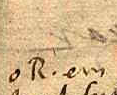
o R. em
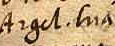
Argel. hia
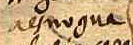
a esnogua
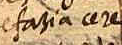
e fazia cere
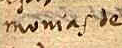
monias de
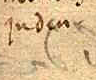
judeu
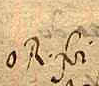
o R. foi
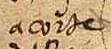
a corte
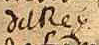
del Rey
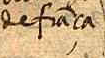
de frāça
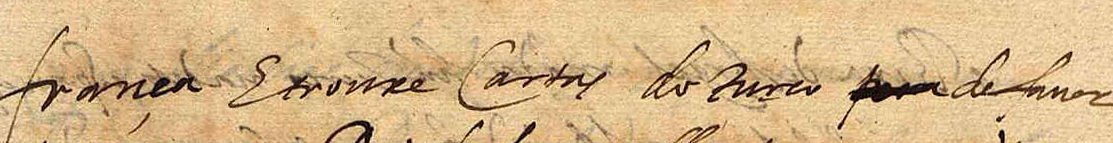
frança E trouxe Cartas do turco pera de fauor
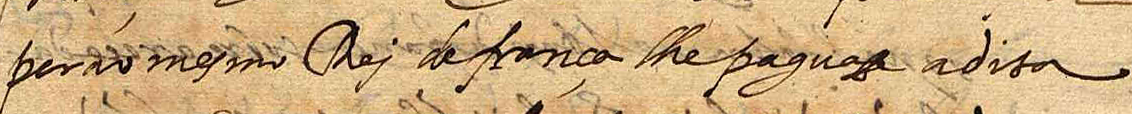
pera o mesmo Rej de frança lhe paguasse a dita
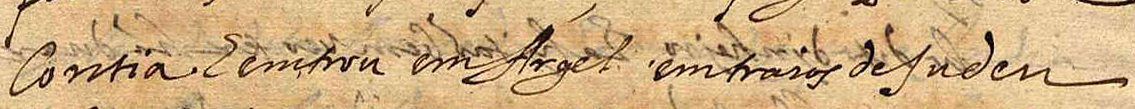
contia E emtrou em Argel em traios de Judeu
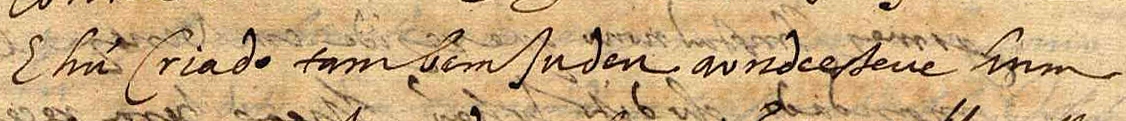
E hū Criado tambem Judeu aonde esteue hum
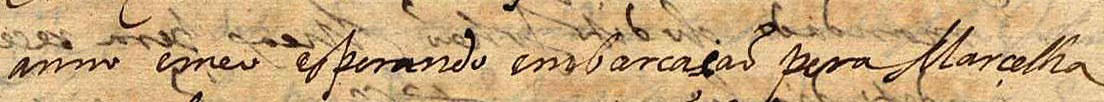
anno e meo esperando embarcaçaõ pera Marcelha
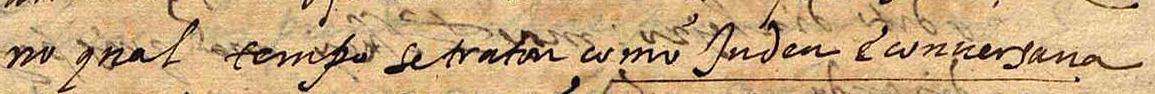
no qual tempo se tratou como Judeu e conuersaua
